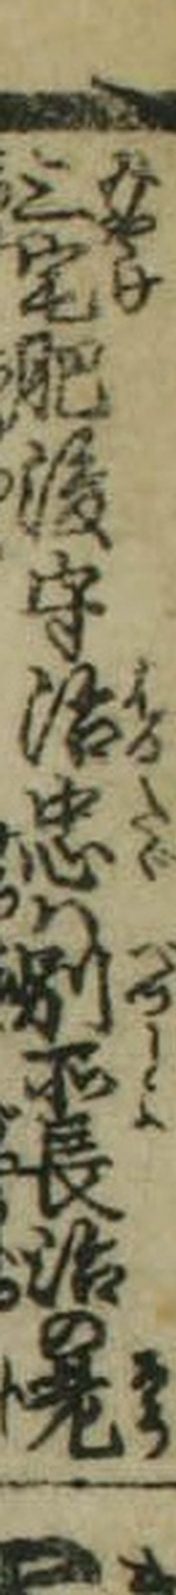三宅肥後守治忠は別所長治の老
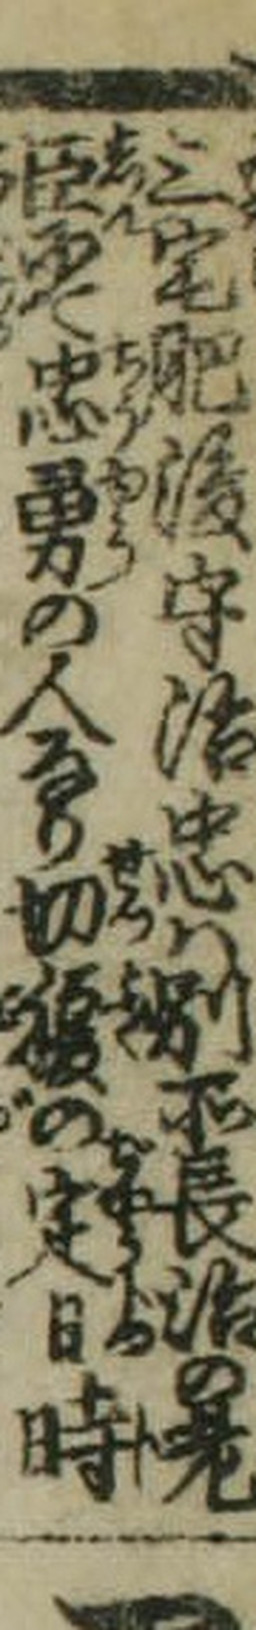臣にて忠勇の人なり切腹の定日時
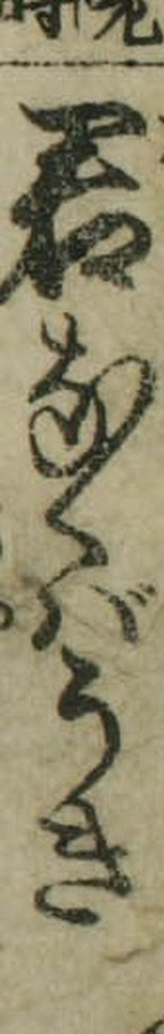君なくばうき
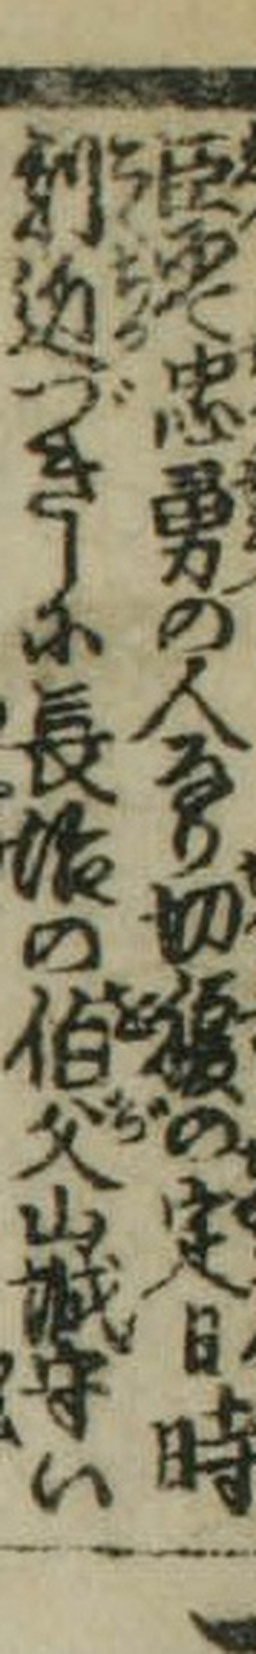刻近づきしに長治の伯父山城守い
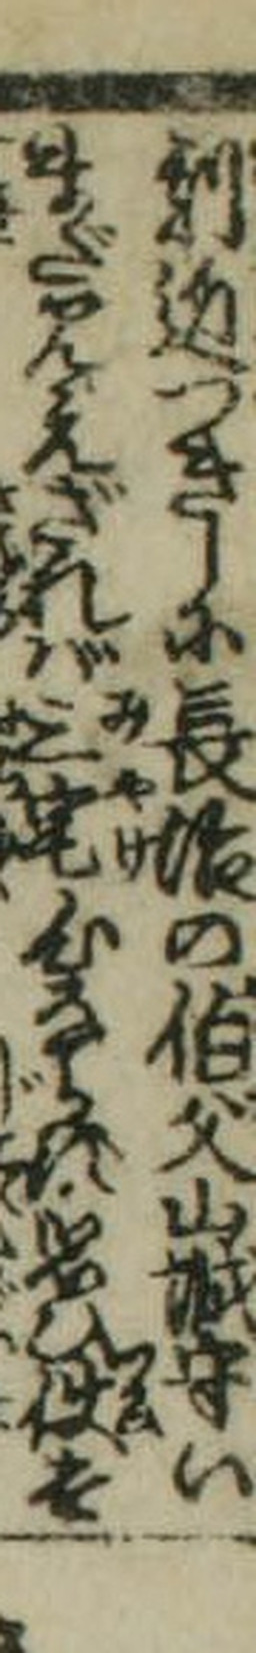まだ見えざれば三宅心ならず思ひ使を
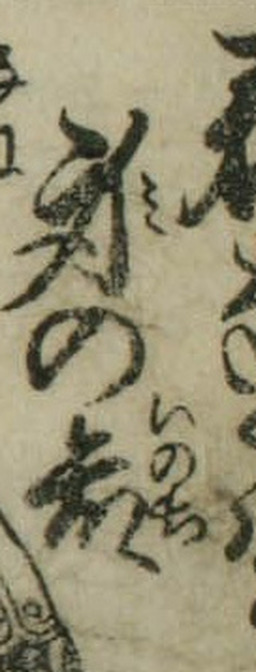身の命
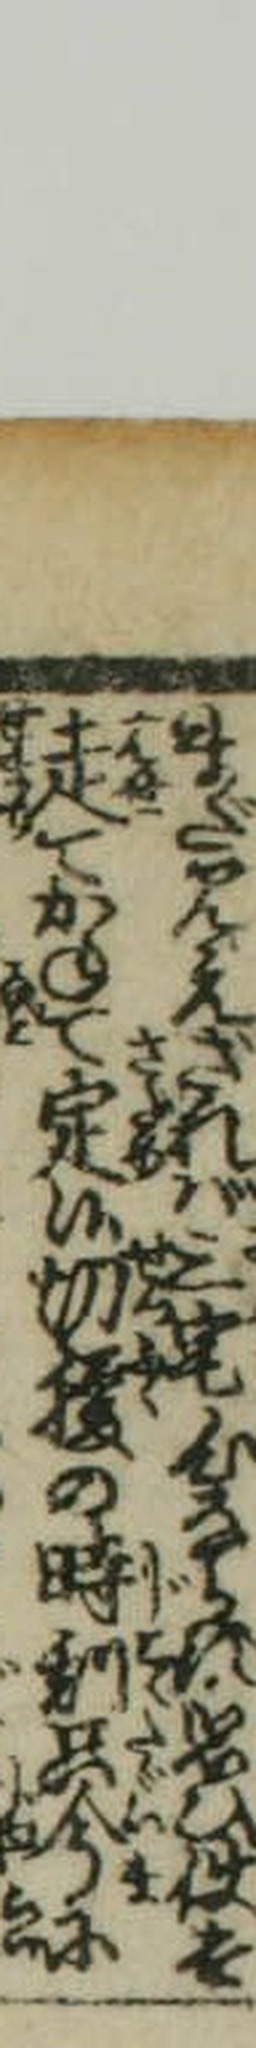走てかねて定候切腹の時刻只今に
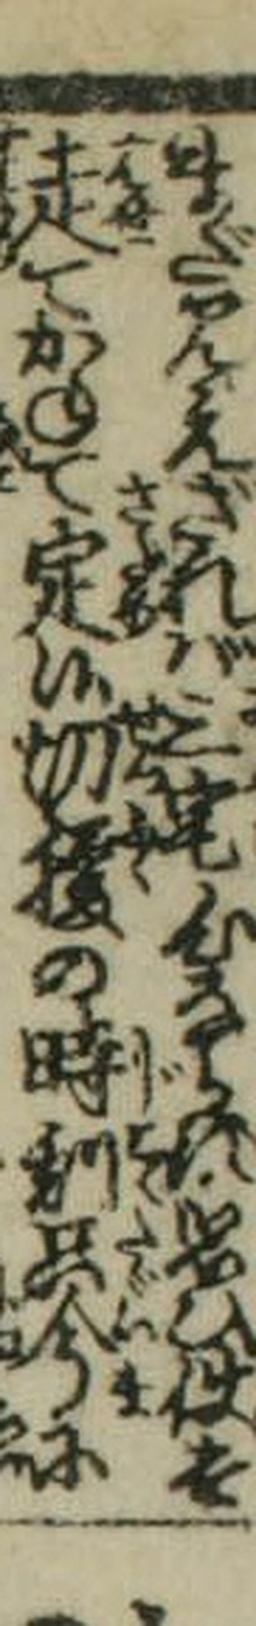走てかねて定候切腹の時刻只今に
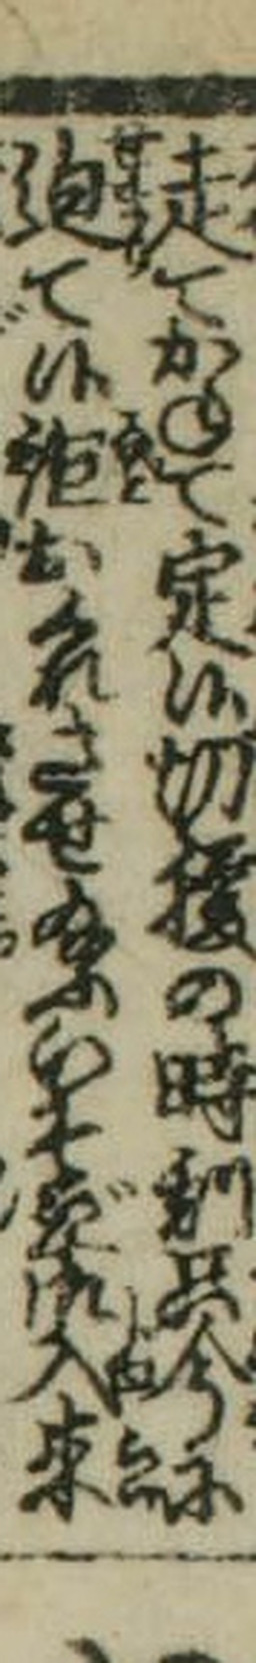迫て候詎おくれさせ給ふいそぎ御入来
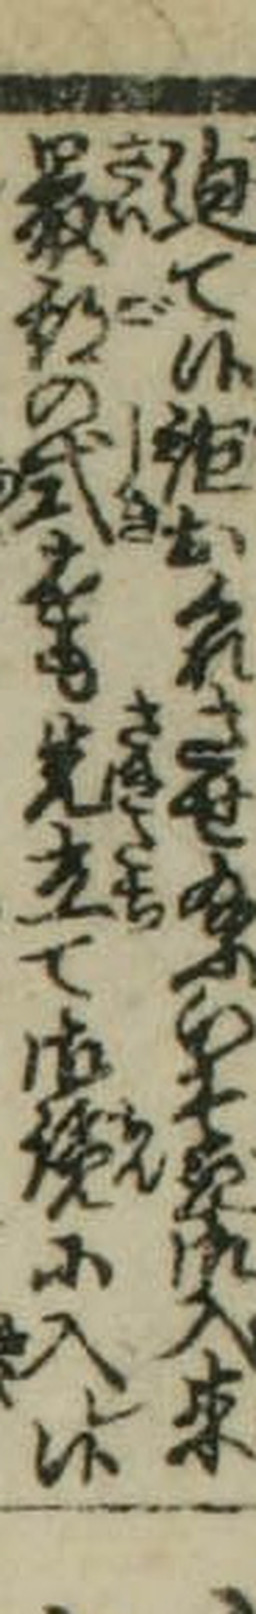最期の式をも先立て御覧に入れ候
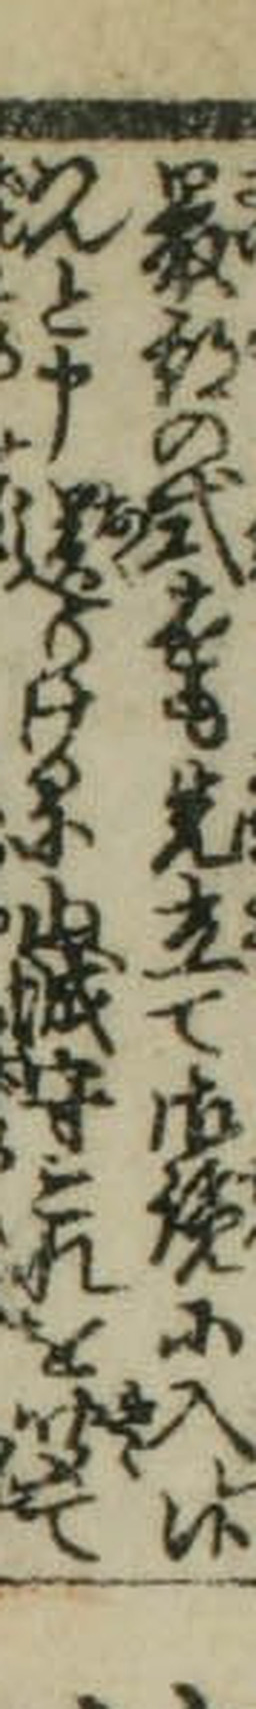はんと申送りけるに山城守これを聞て
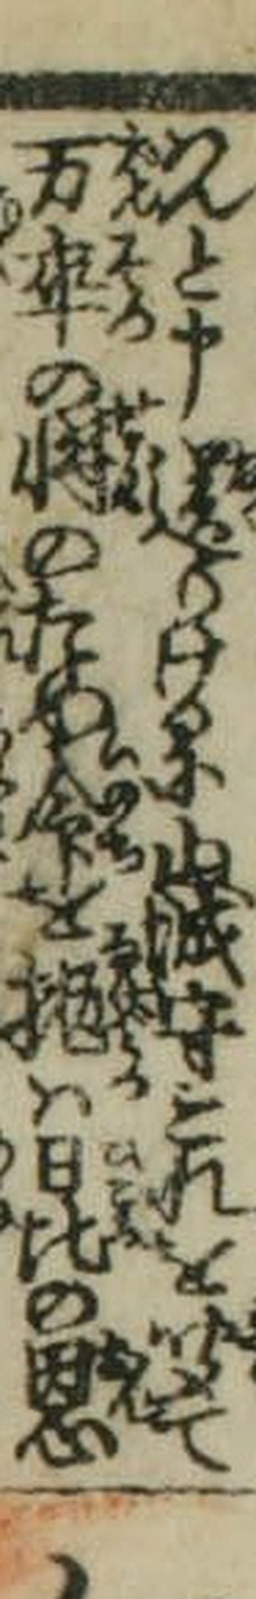万卒の将のため命を抛は日比の恩
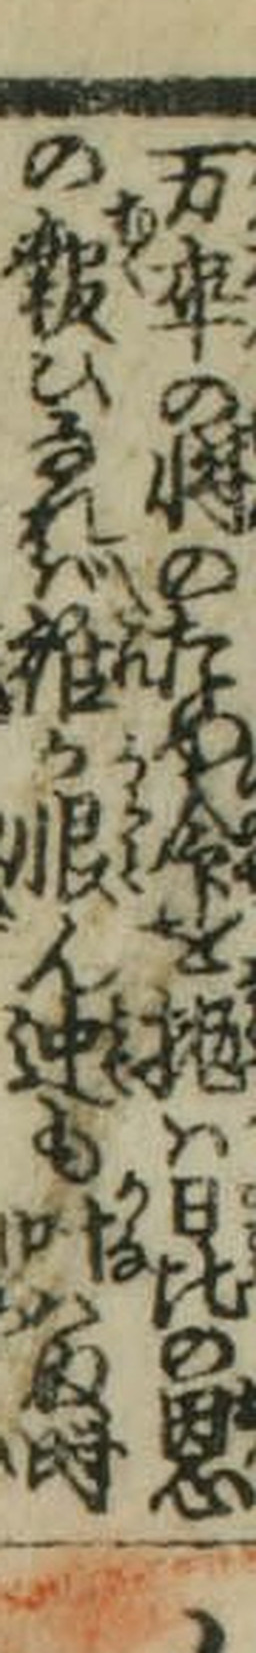の報ひなれば誰か恨ん迚も叶はぬ時
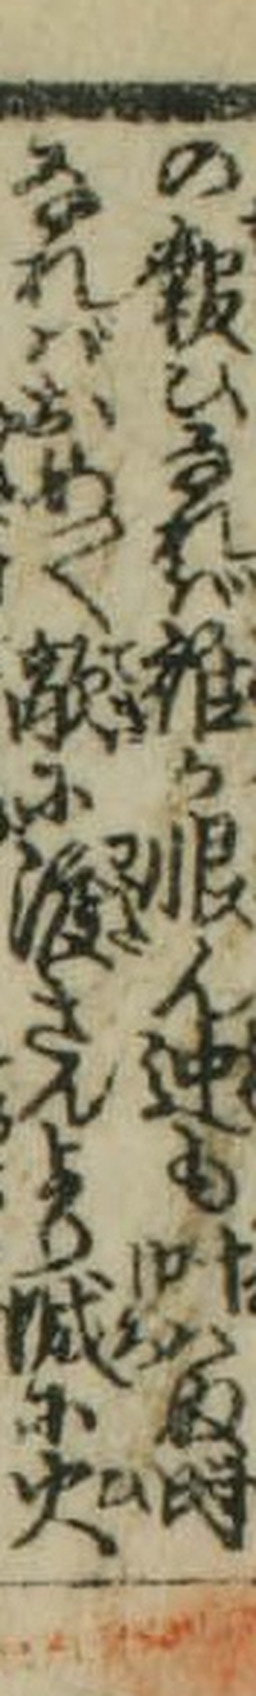なればおめ〳〵敵に渡さんより城に火
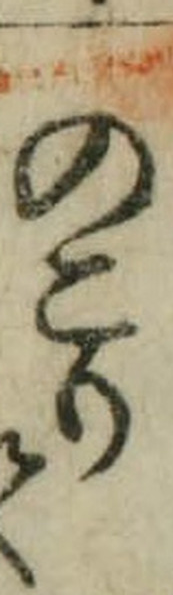のこりて
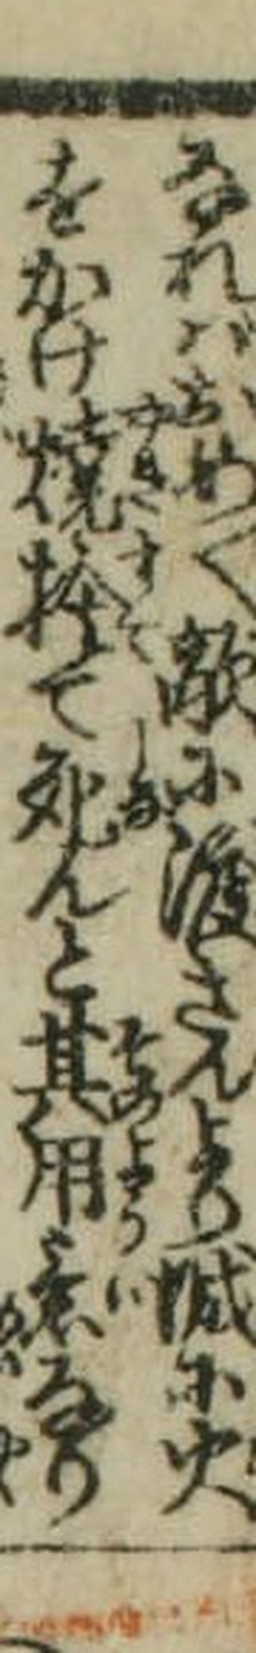をかけ焼捨て死んと其用意なり
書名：續英雄百人一首
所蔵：東京学芸大学附属図書館
